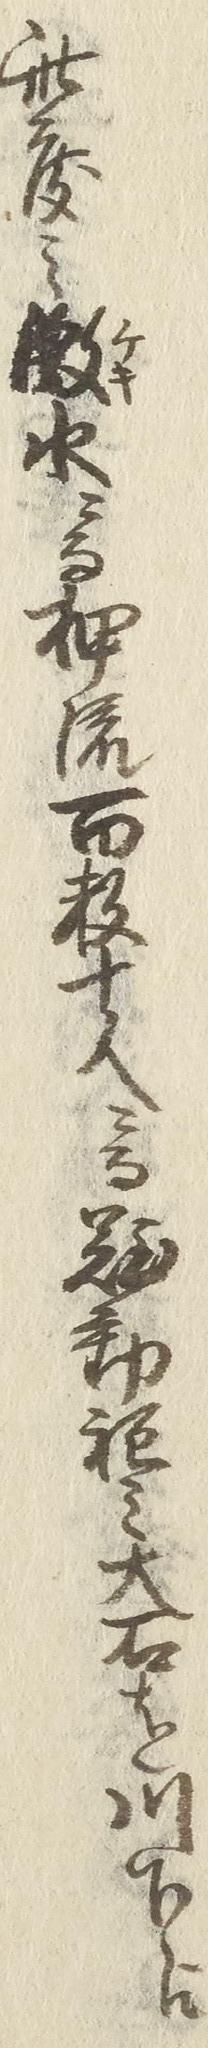此度之激水ニ而押流百数十人ニ而難動程之大石を川下江
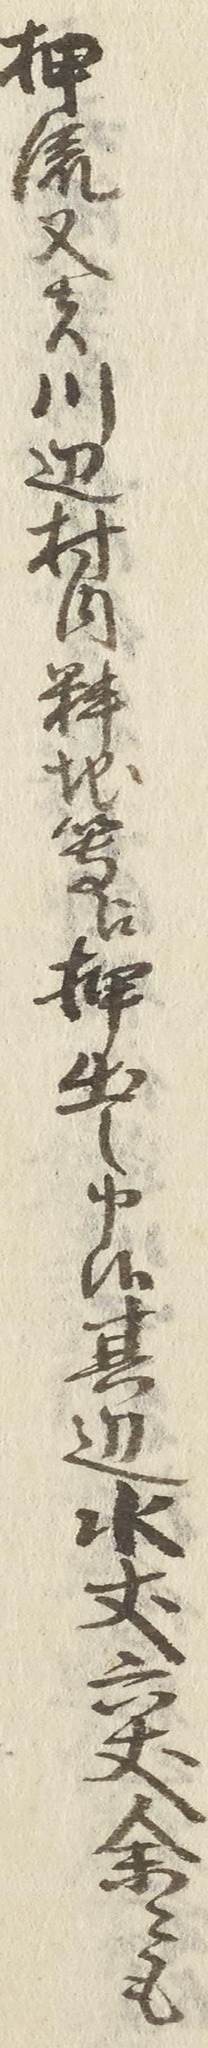押流又は川辺村内耕地等江押出し申候其辺水丈六丈余ニも
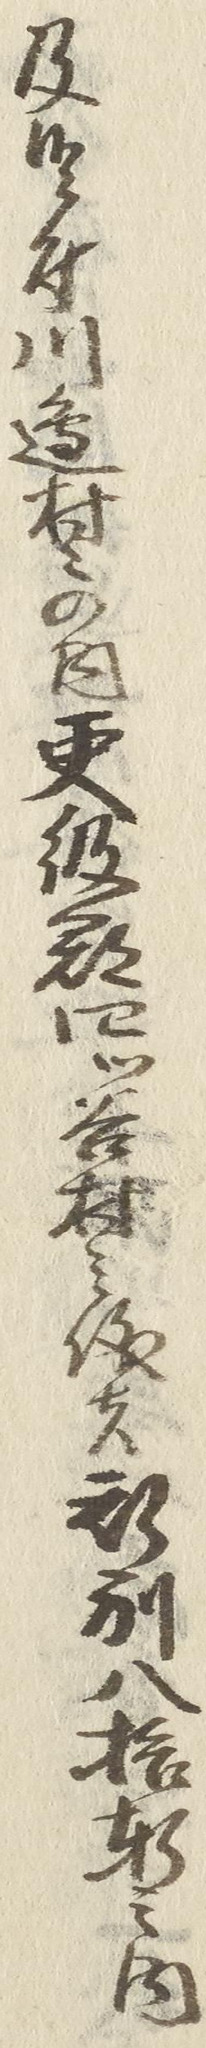及候ニ付川辺村々の内更級郡四ツ谷村之義儀は斯別八拾軒之内
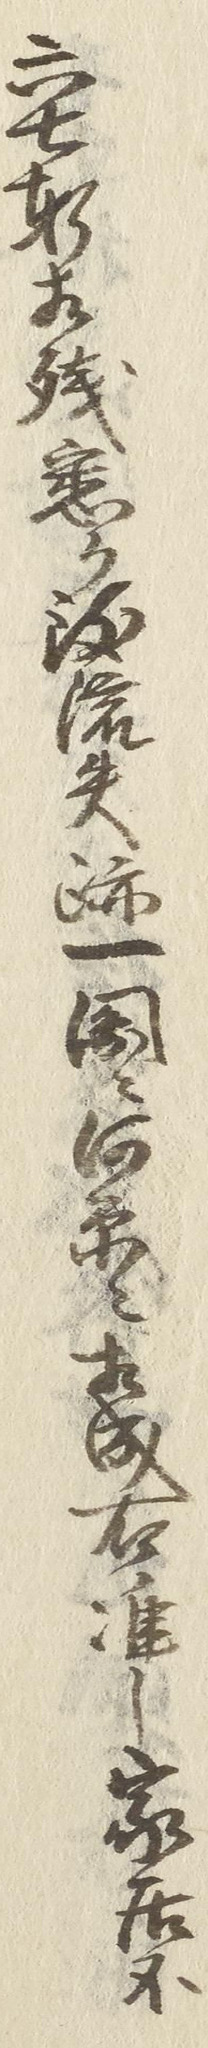六七軒相残悉ク致流失跡一円ニ何原ニ相成右准し家居不
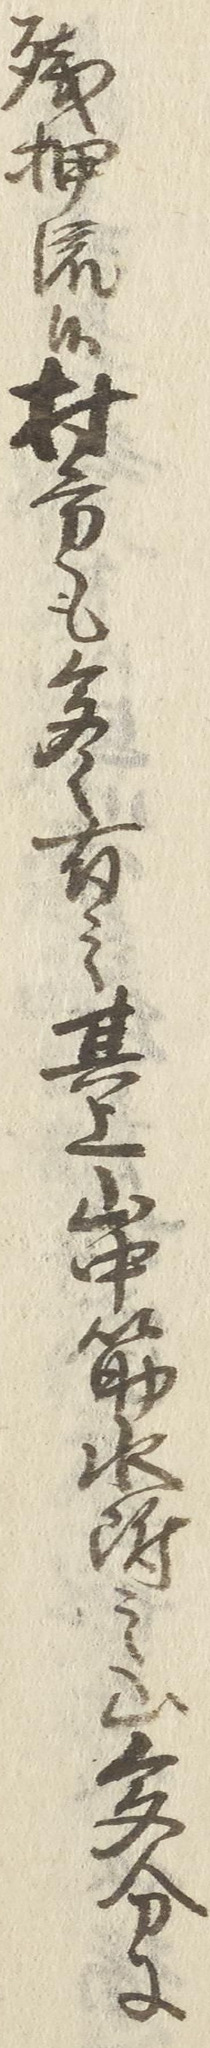残押流候村方も多く有之其上山中筋水附之山多分に
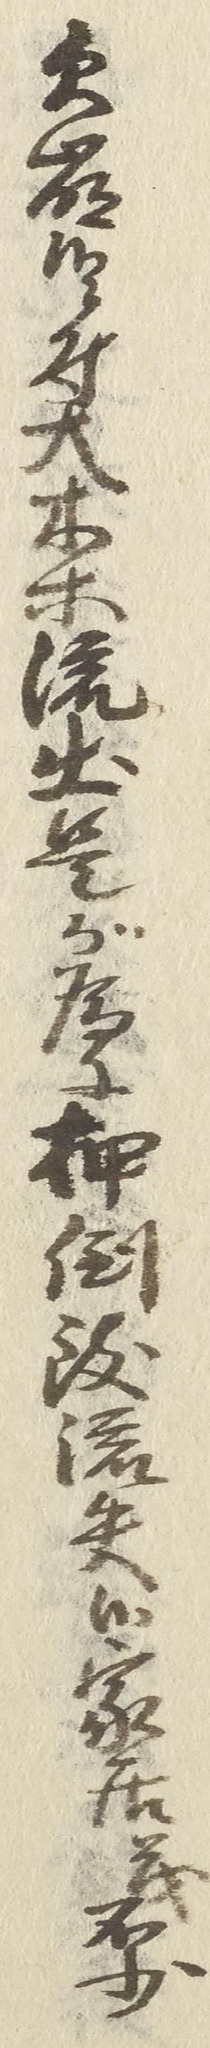欠崩候ニ付大木等流出是が為に押倒致流失候家居も不少

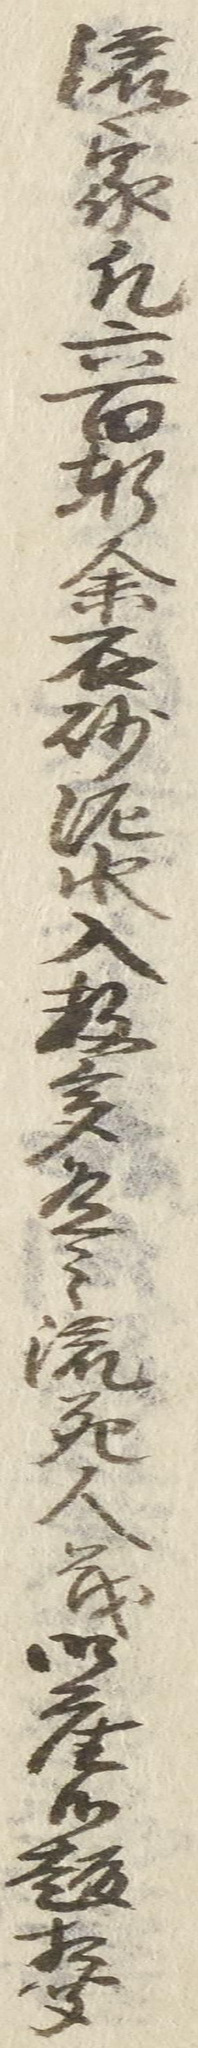流家凡六百軒余石砂泥水入数多有之流死人も御座候趣相聞
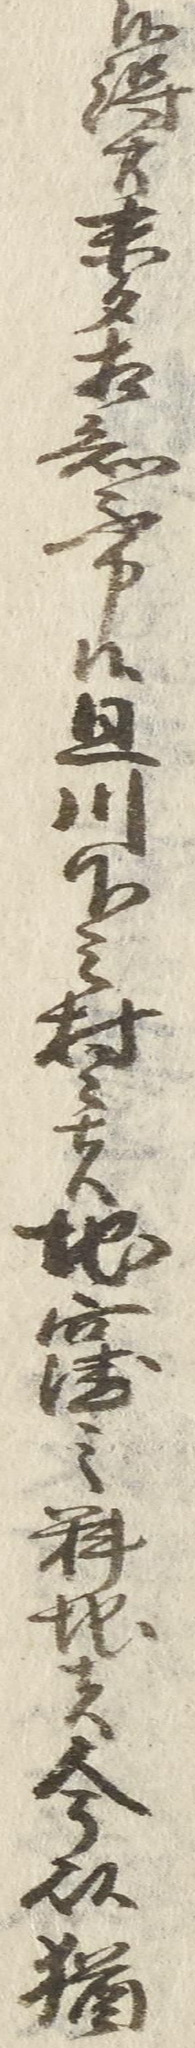候得共未タ相知不申候且川下之村々は地窪之料地は今以猶
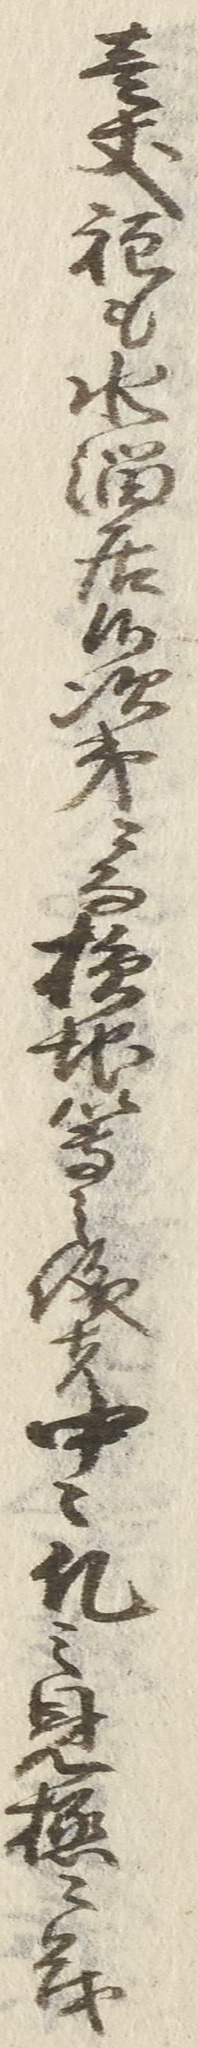壱丈程も水溜居候次第ニ而損地等之儀は中々凡之見極ニも
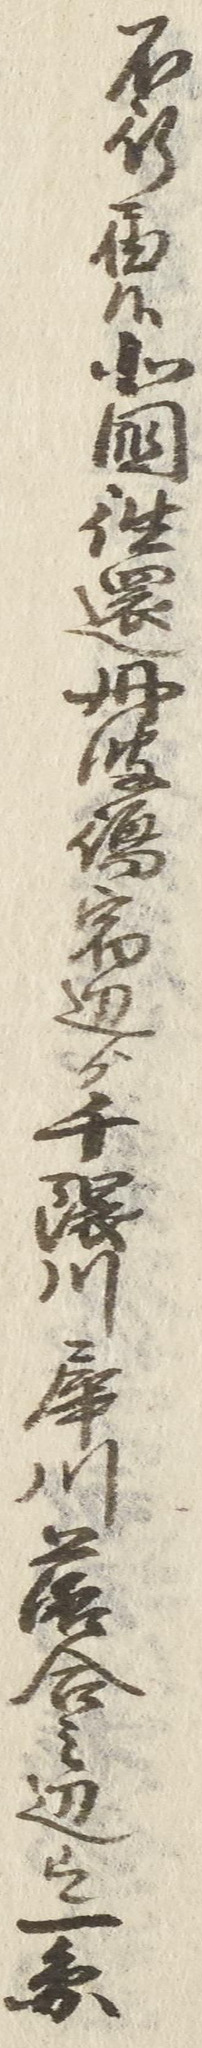不行届候北国往還丹波嶋宿辺ゟ千隈川犀川落合之辺は一円
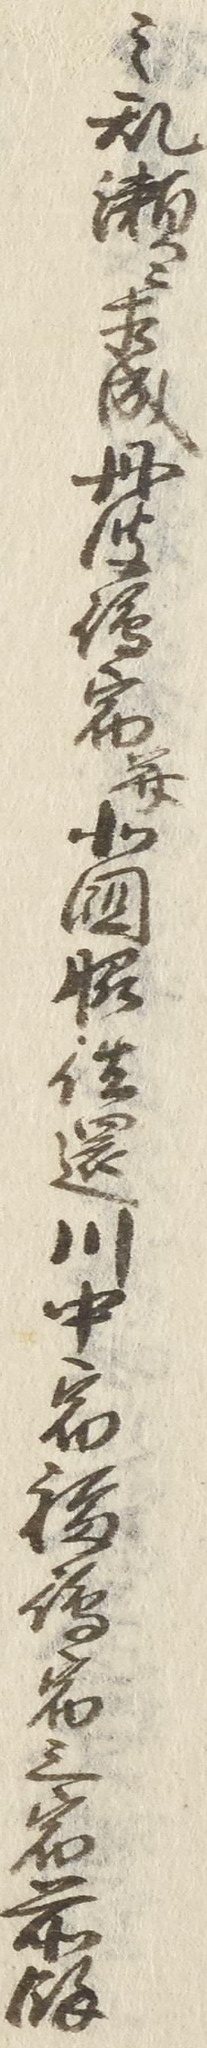之乱瀬ニ相成丹波嶋宿并北国脇往還川中宿福嶋宿三宿前余
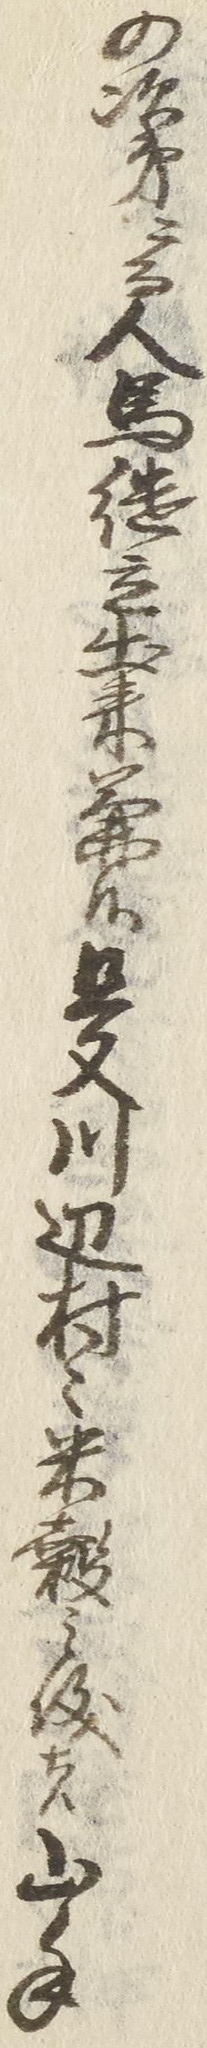の次第ニ而人馬継立出来兼候且又川辺村々米穀之儀は山手
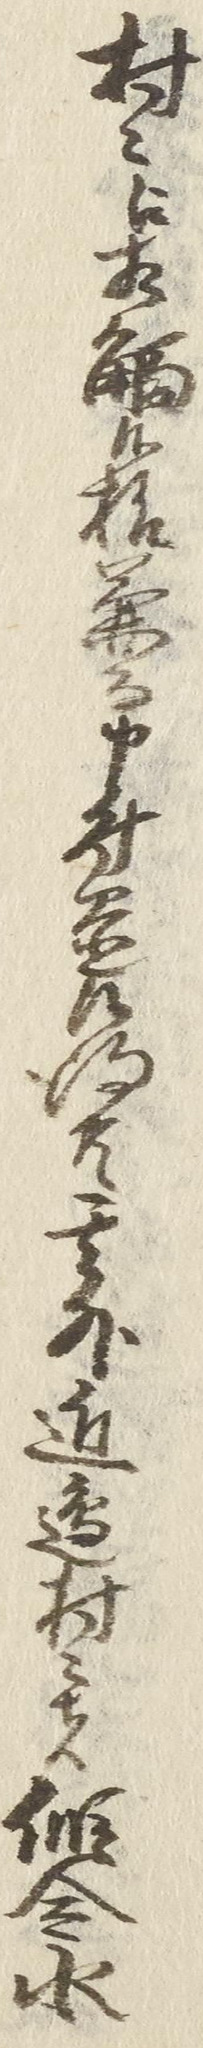村々江相触候様兼而申付置候得共其外近辺村々は仮令水
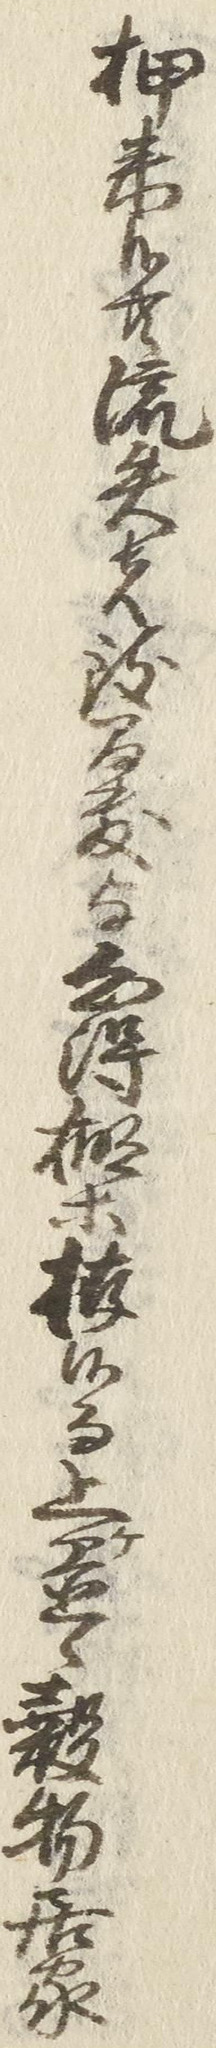押来流失は致間敷与心得棚等拵候而上ケ置候穀物居家
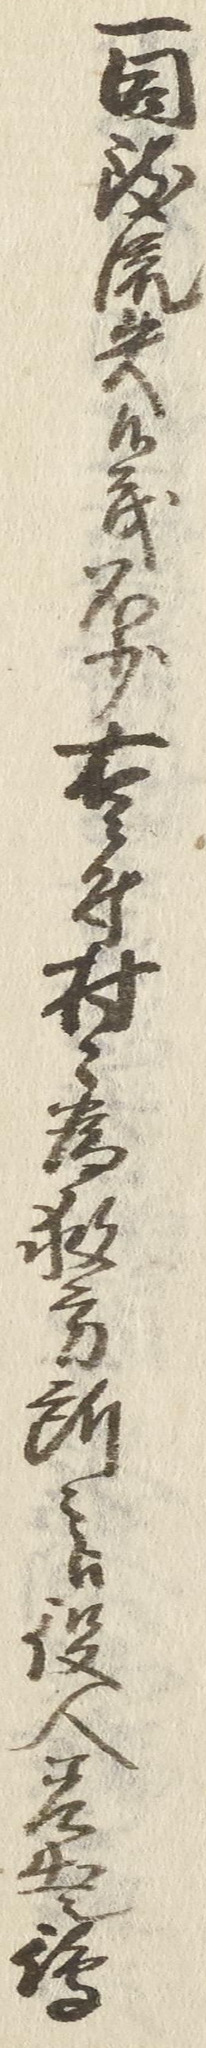一同致流失候も不少右ニ付村々為救方所々江役人差出シ嶋
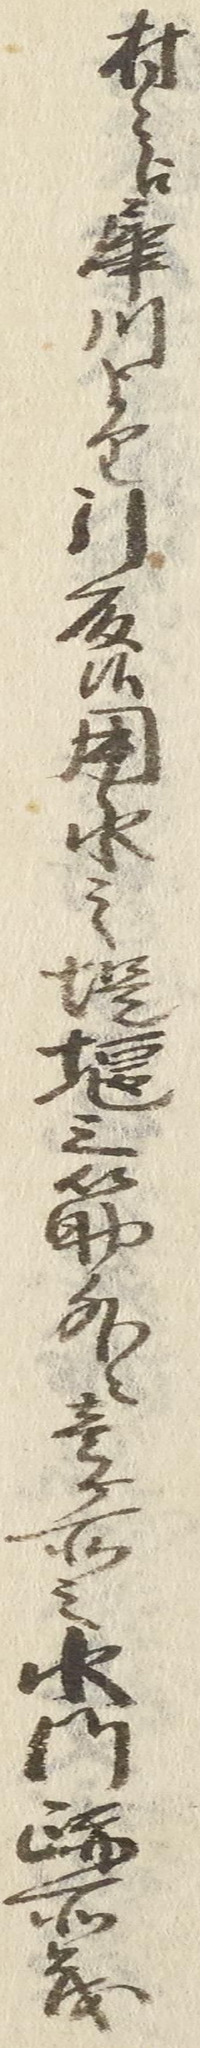村々江犀川より引取候用水堤堰之筋外ニ壱ヶ所之水門跡所も
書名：従往古地震御届書記誌之一
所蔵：東京大学地震研究所図書室 Earthquake Research Institute Library, The University of Tokyo, JAPAN
